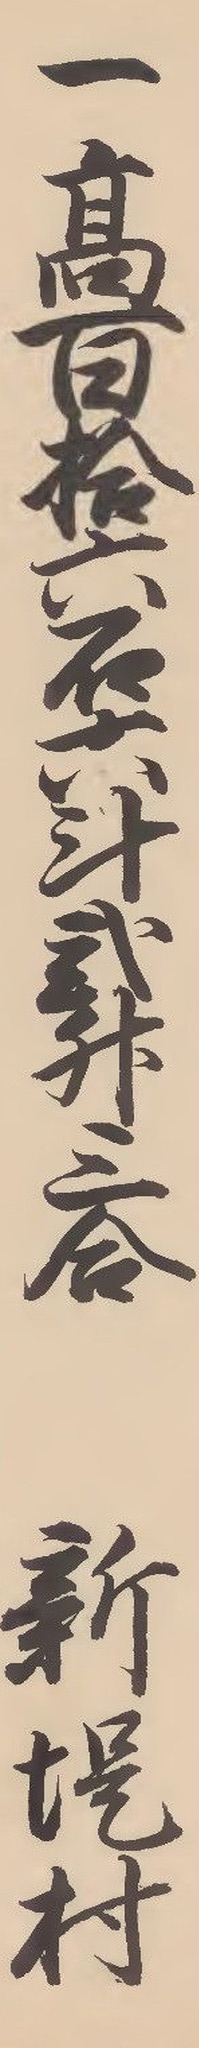一高百拾六石六斗弐升三合新堤村
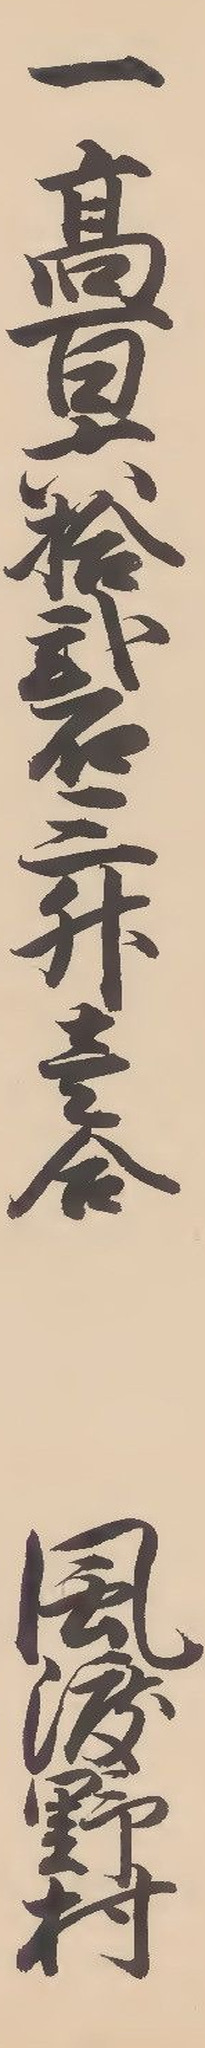一高百六拾弐石三升壱合風渡野村
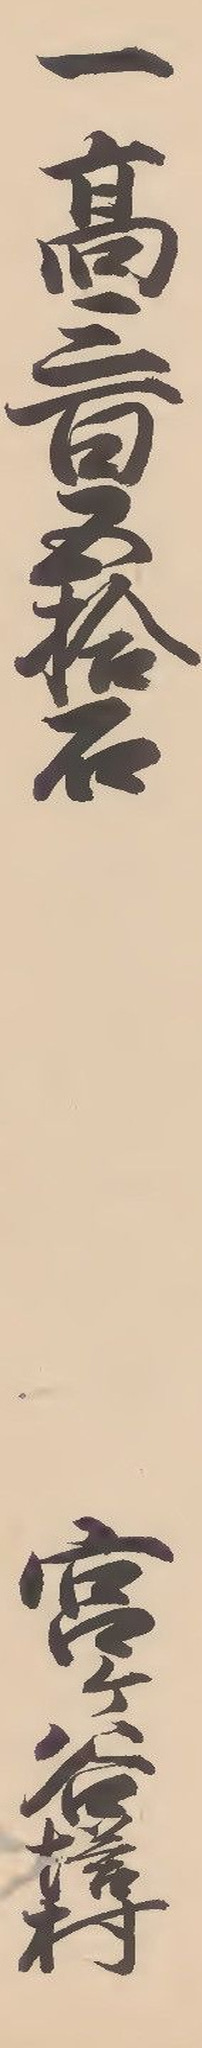一高三百五拾石宮ヶ谷塔村

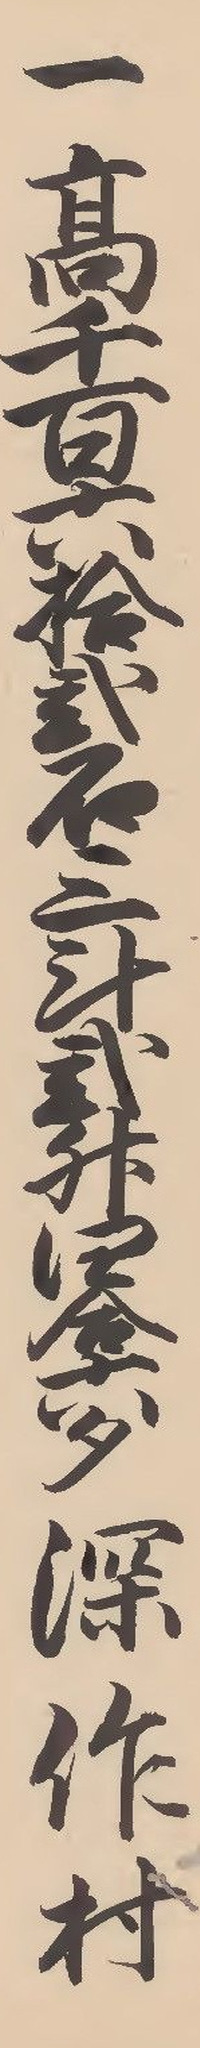一高千百六拾弐石三斗弐升四合六勺深作村
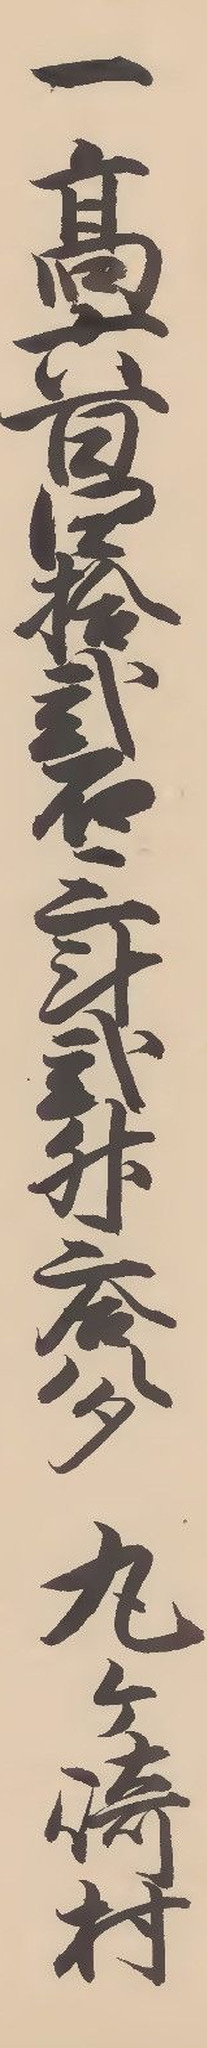一高六百四拾弐石三斗弐升三合八勺九ヶ崎村
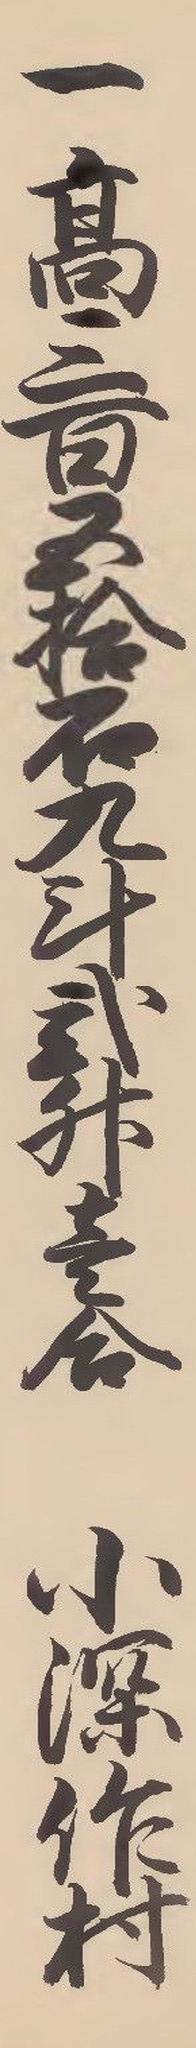一高三百五拾石九斗弐升壱合小深作村
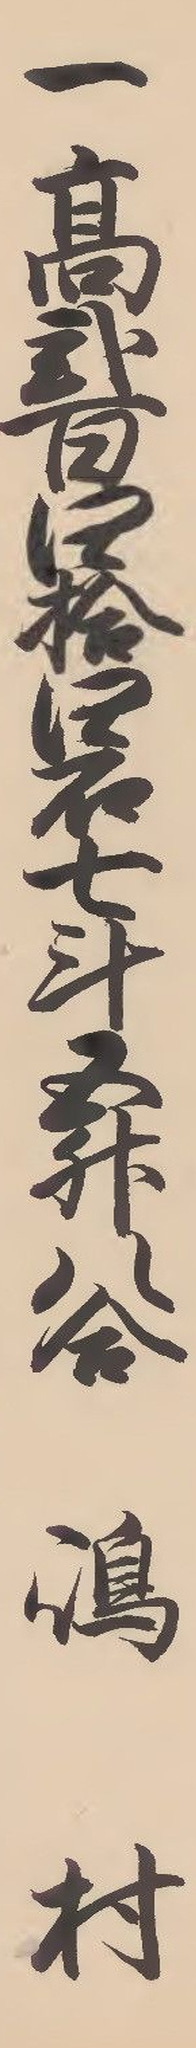一高弐百四拾四石七斗五升八合嶋村
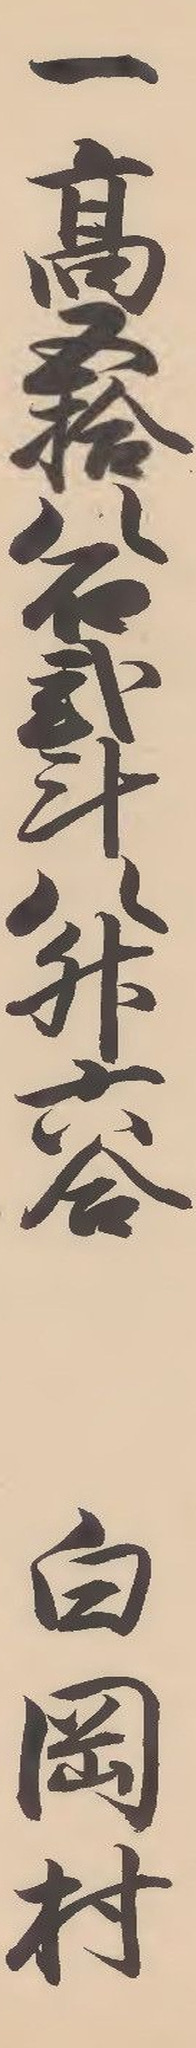一高五拾八石弐斗八升六合白岡村
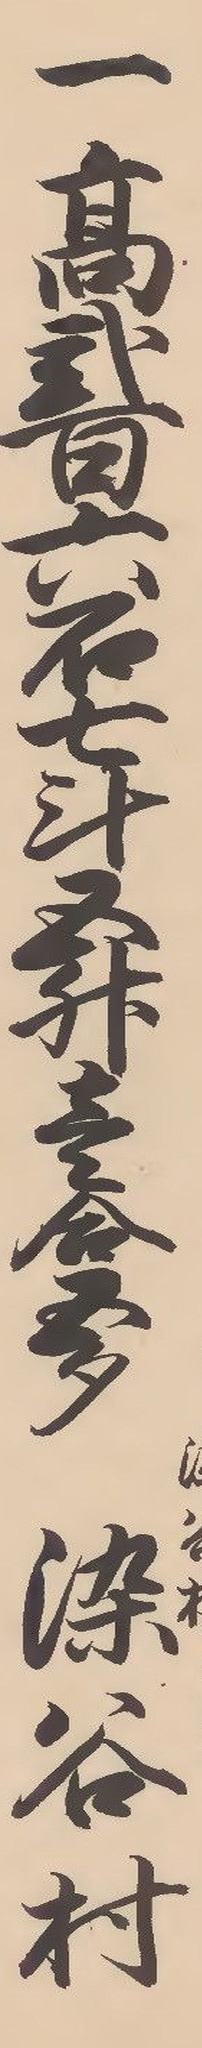一高弐百六石七斗五升壱合五勺染谷村

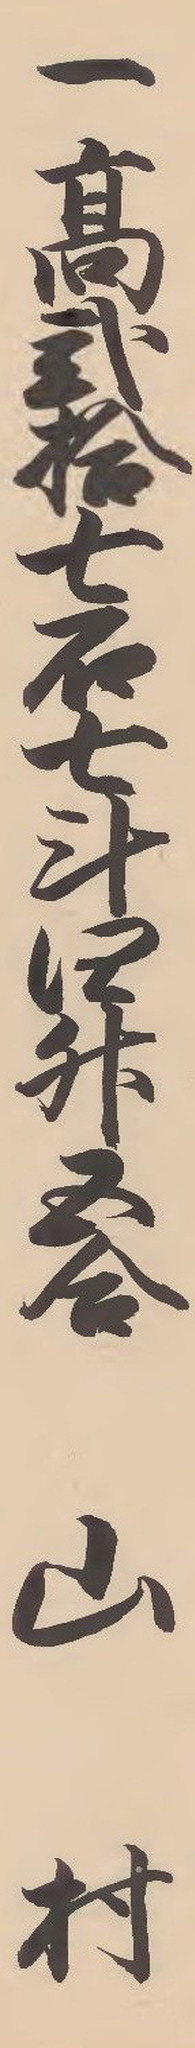一高弐拾七石七斗四升五合山村
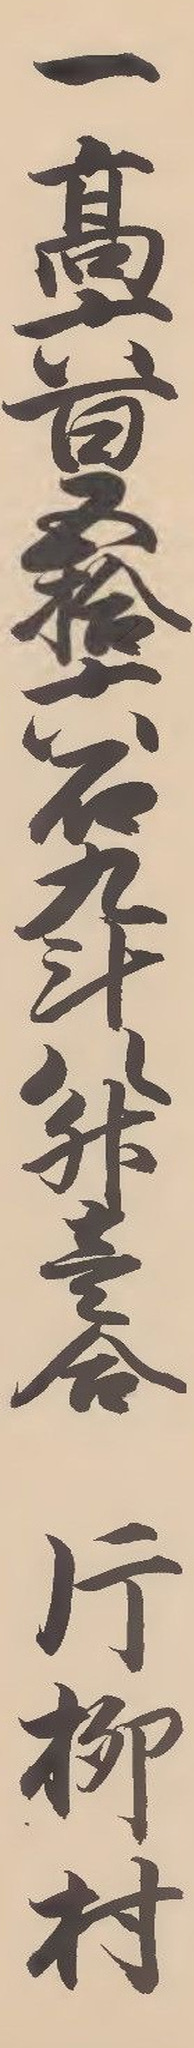一高六百五拾六石九斗八升壱合片柳村
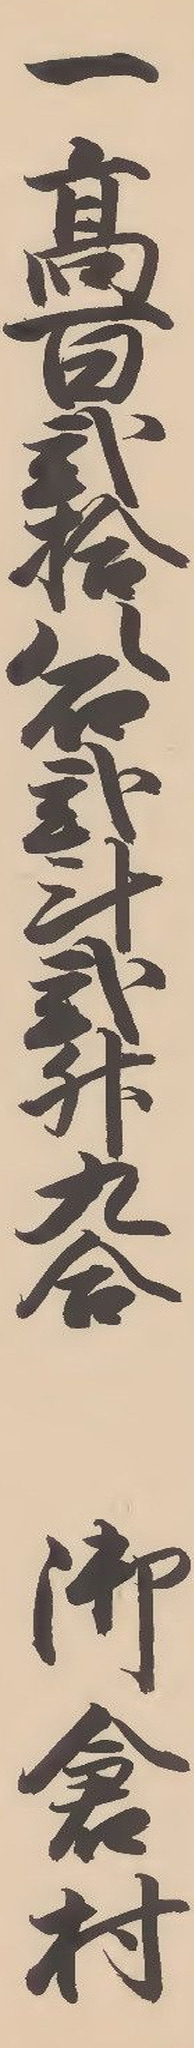一高百弐拾八石弐斗弐升九合御倉村
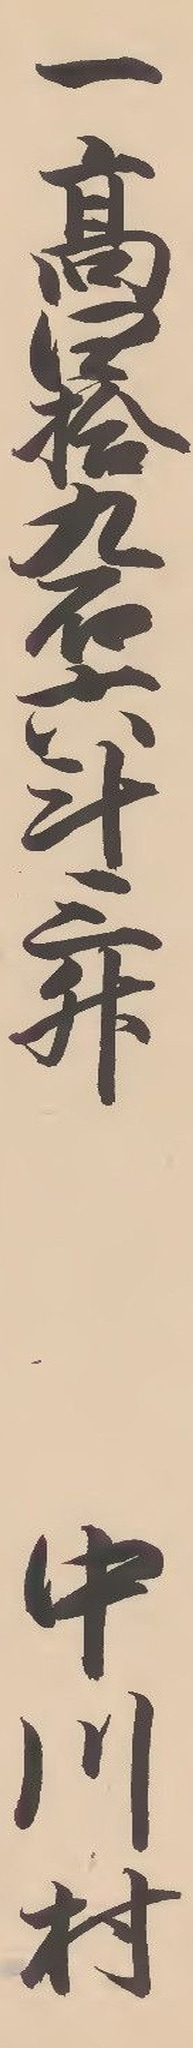一高四拾九石六斗三升中川村
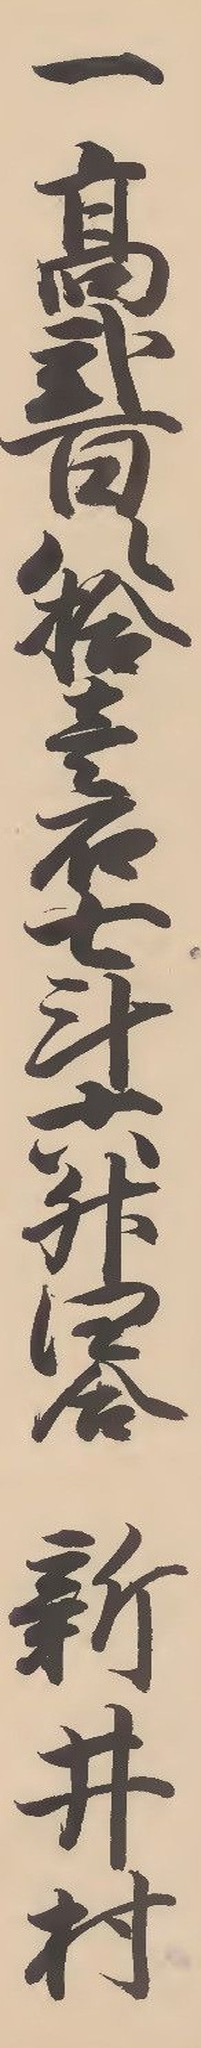一高弐百八拾壱石七斗六升四合新井村
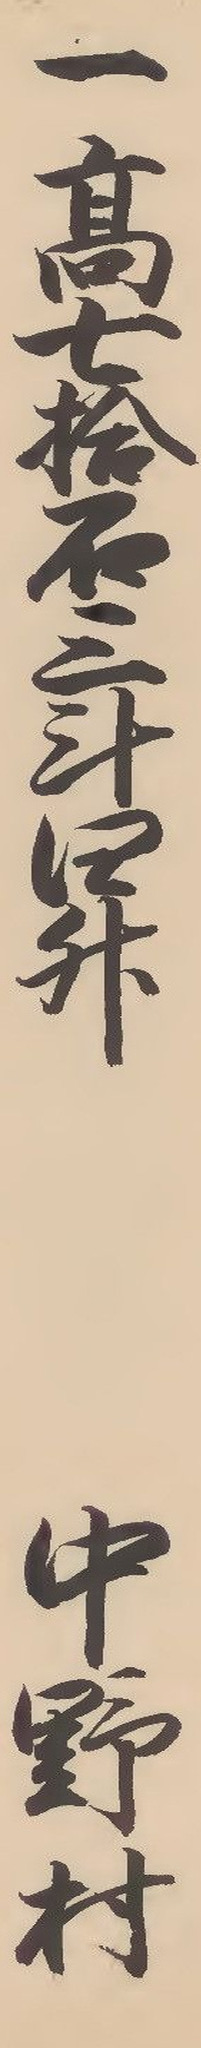一高七拾石三斗四升中野村
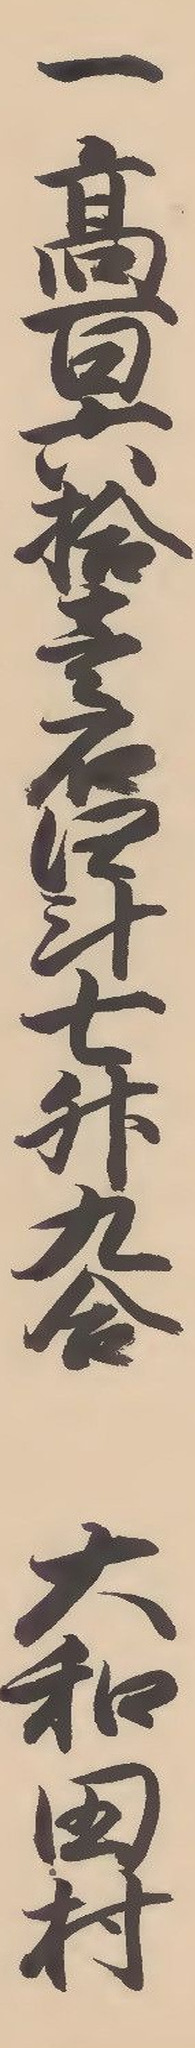一高百六拾壱石四斗七升九合大和田村
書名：武蔵国郷帳　下
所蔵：国立公文書館 National Archives of Japan
